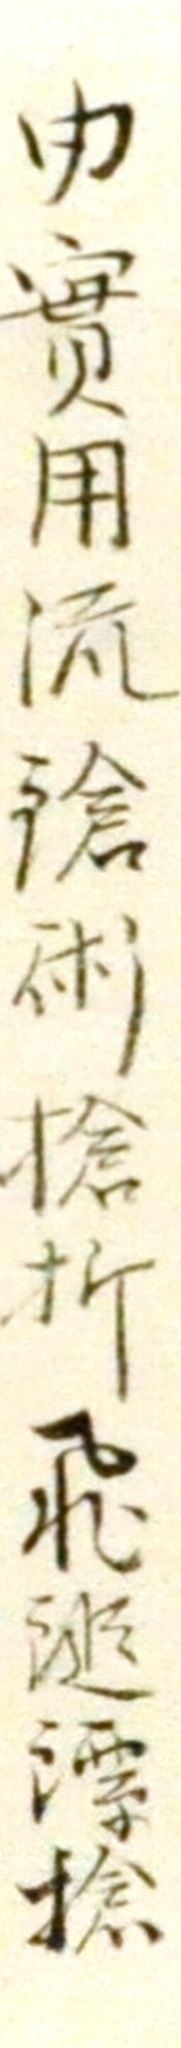由実用流鎗術槍折飛鎚鏢槍
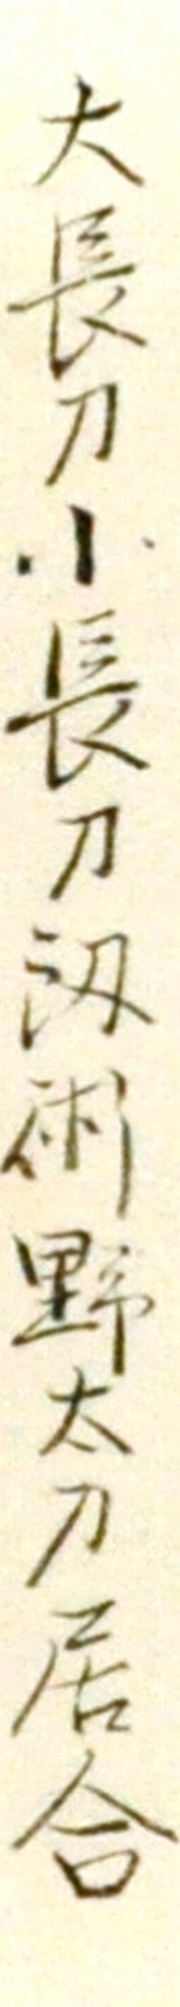大長刀小長刀剣術野太刀居合
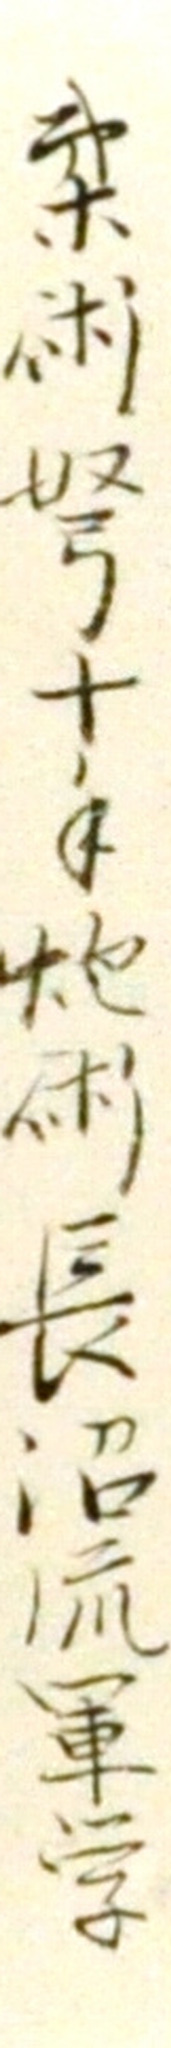柔術弩十手砲術長沼流軍学
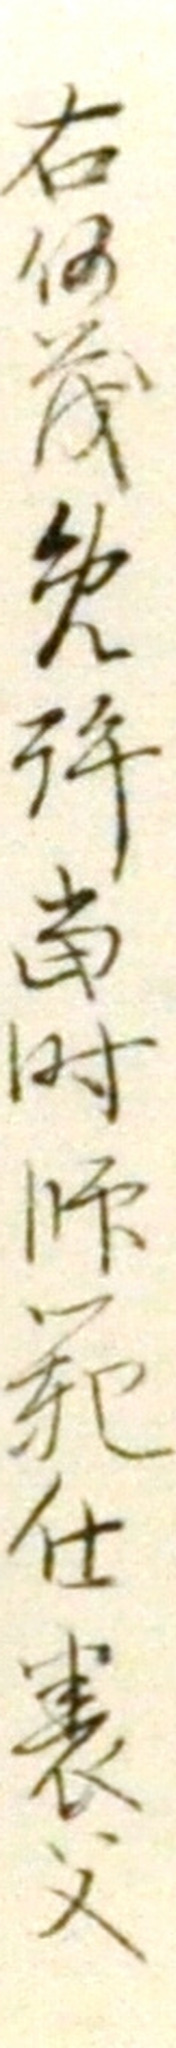右何茂免許当時師範仕養父
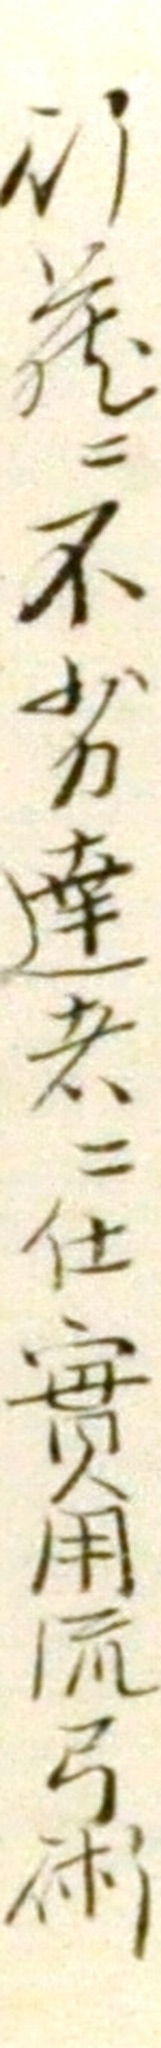行蔵ニ不劣達者ニ仕実用流弓術
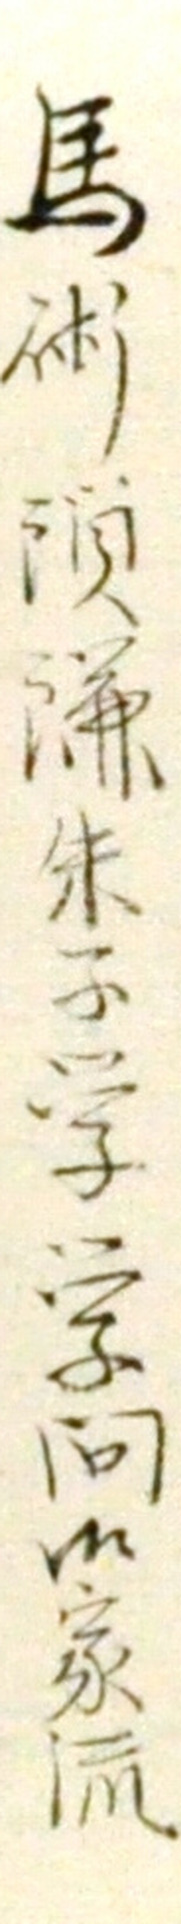馬術鎖鎌朱子学学問御家流
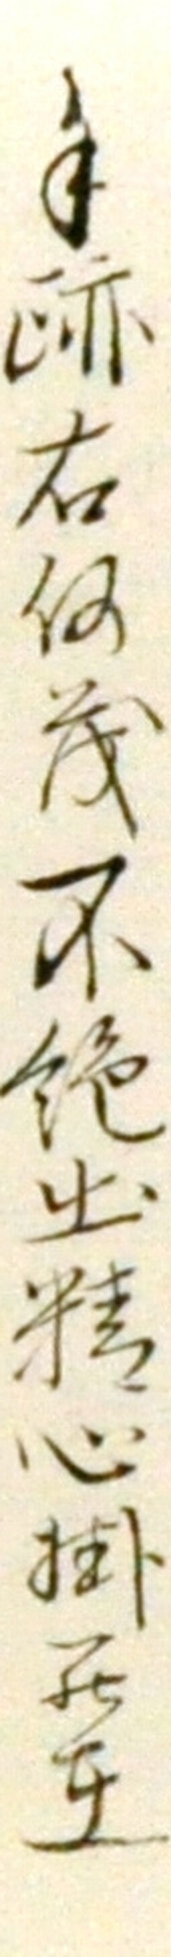手跡右何茂不絶出精心掛罷在
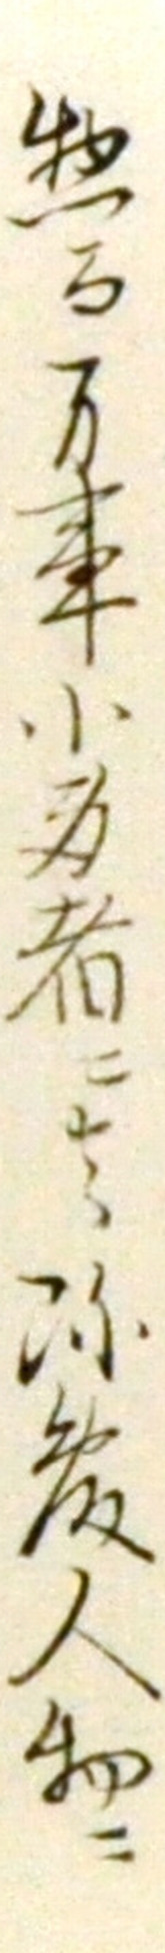惣而万事小身者ニ者珍敷人物ニ
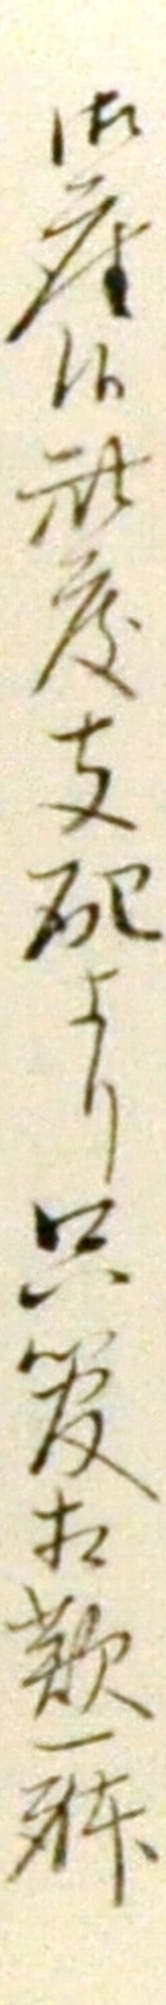御座候此度支配より只管相歎一体
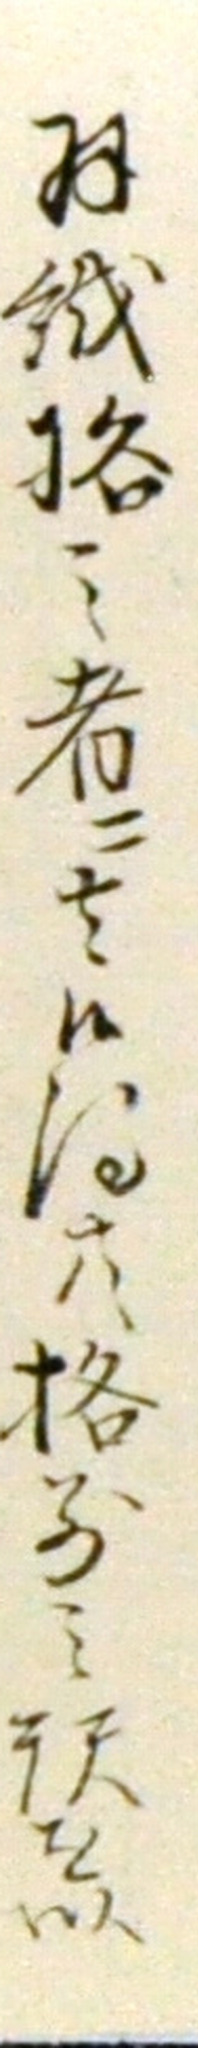羽織格之者ニ者候得共格別之訳を以
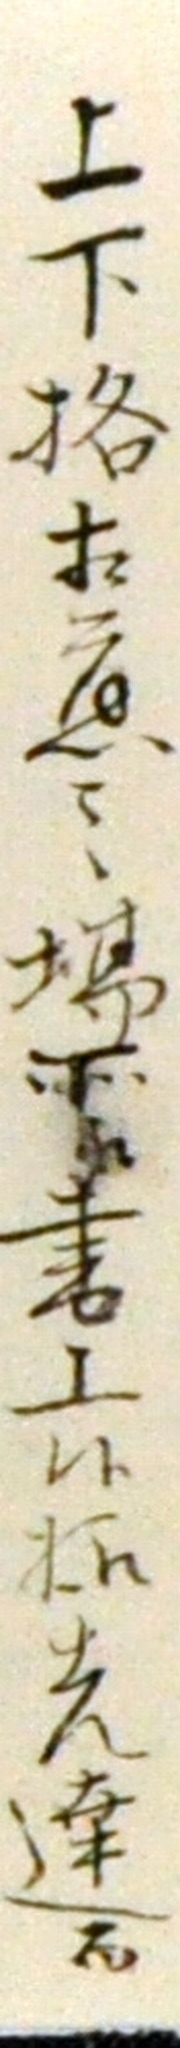上下格相応之場所江書上候様先達而

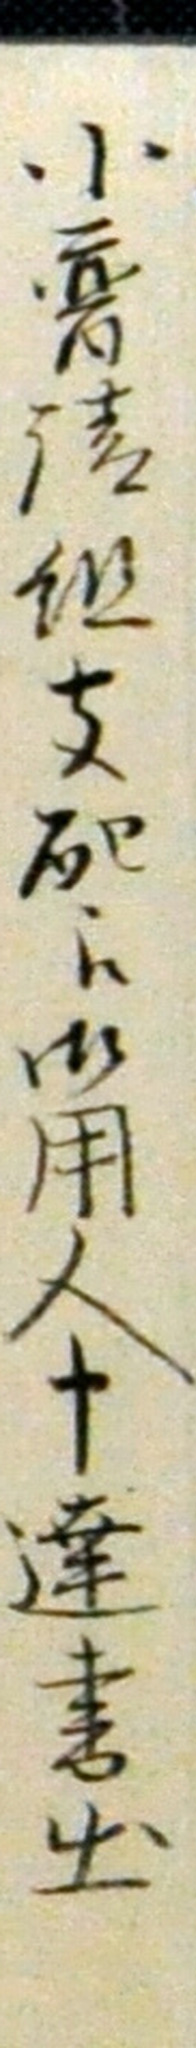小普請組支配江御用人申達書出
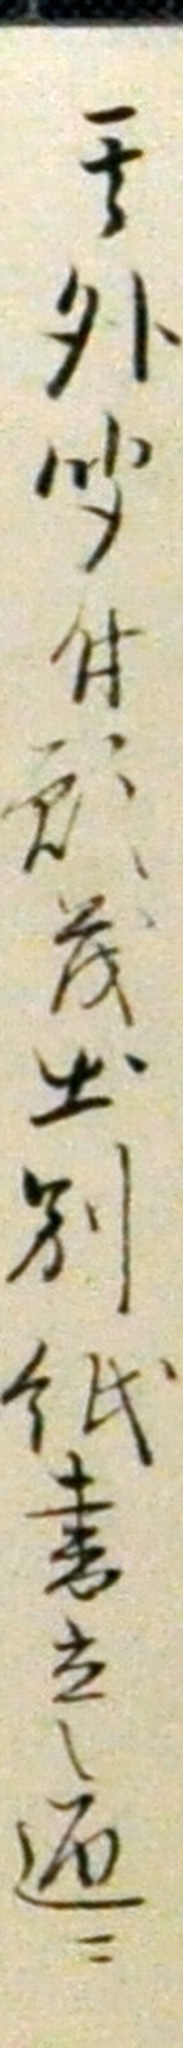其外聞付願茂出別紙書立之通ニ
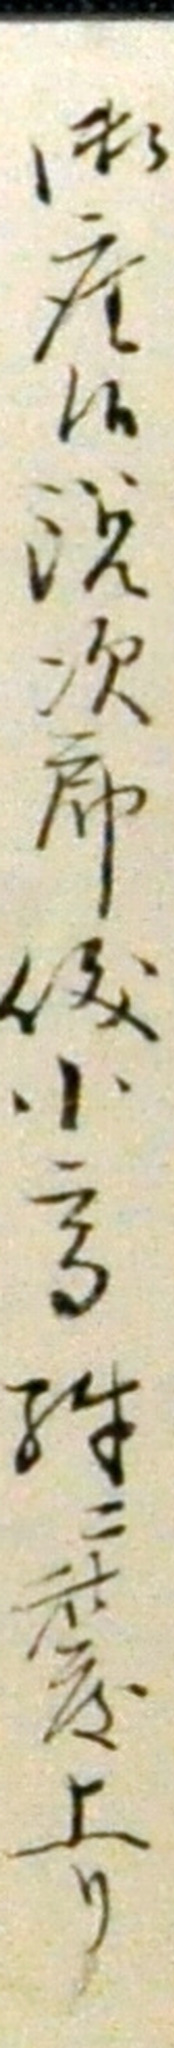御座候鋭次郎儀小高殊ニ此度上リ
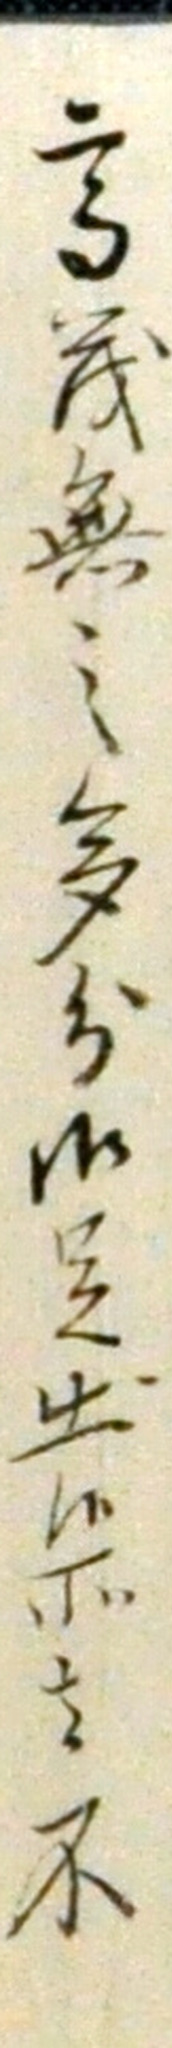高茂無之多分御足出候所者不
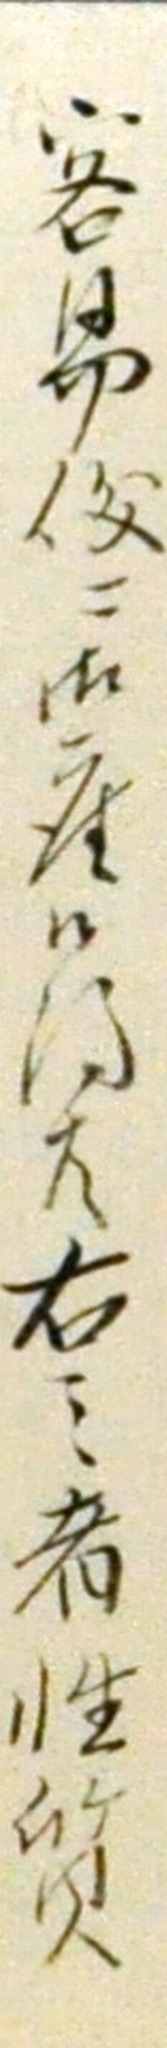容易儀ニ御座候得共右之者性質
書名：西丸表火之番調
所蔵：伊那市立高遠町図書館・合同会社AMANE
